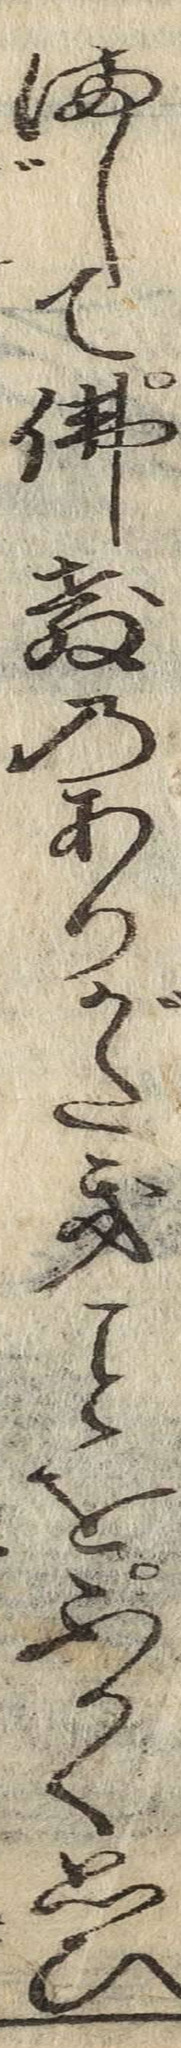まして。仏教のありがたきことを。ふかく思ひ
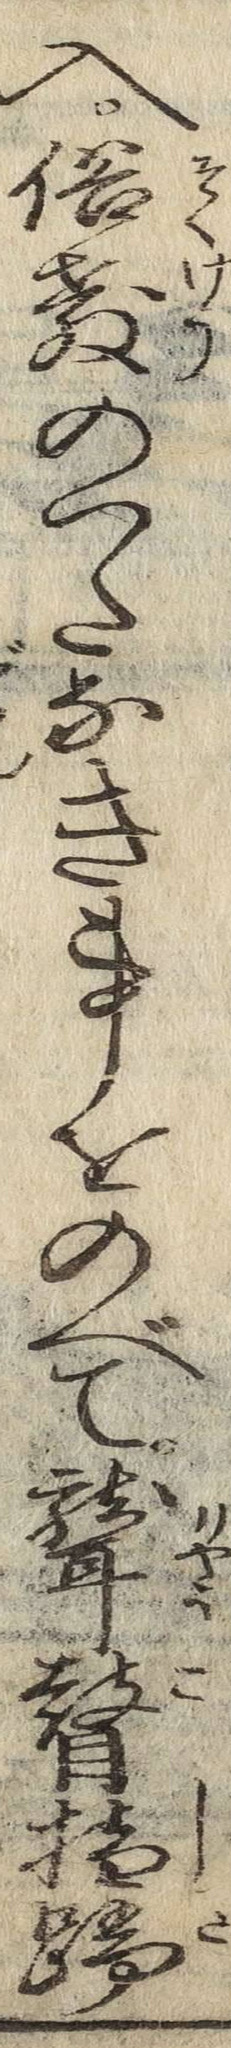入。俗教のつたなき事をのべて。聾瞽指帰
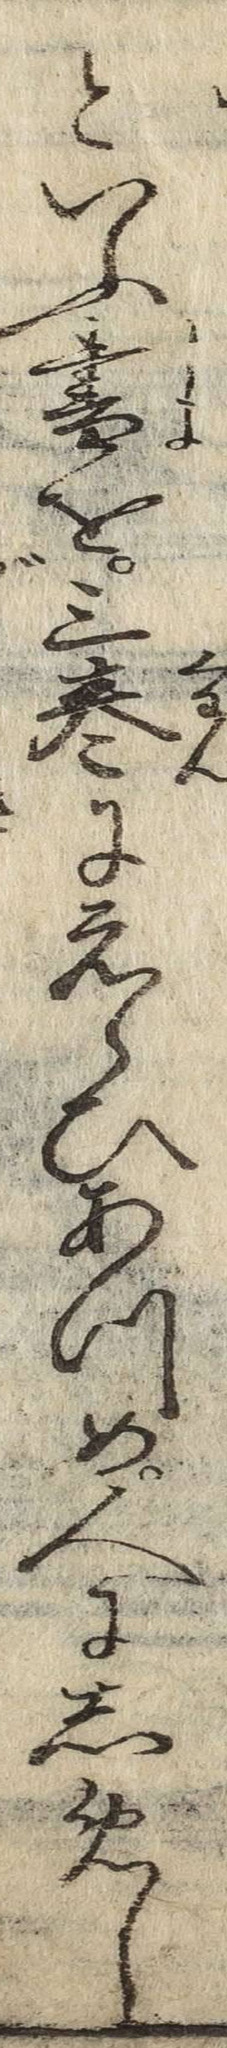といふ書を。三巻にえらひあつめ。人にしめし
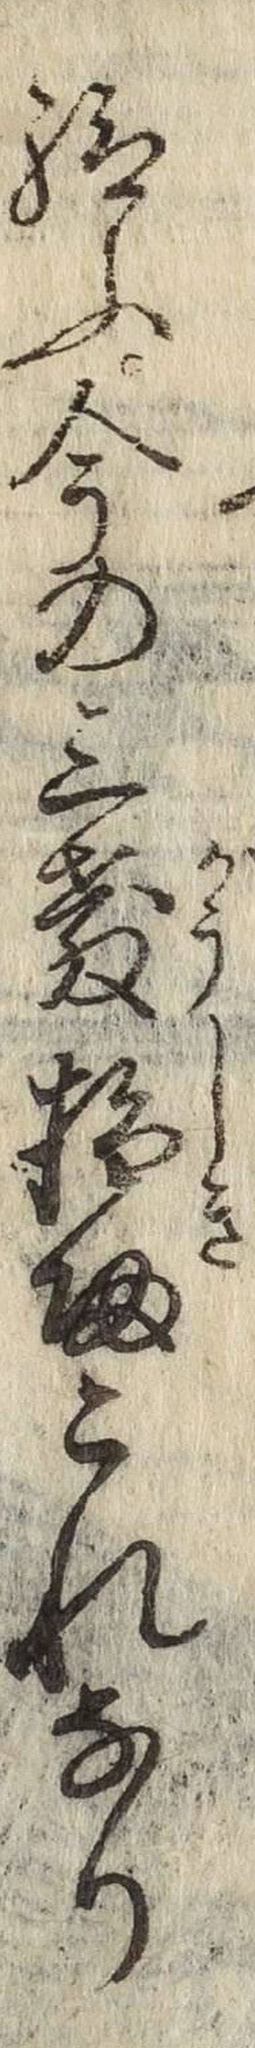給ふ。今の三教指帰これなり

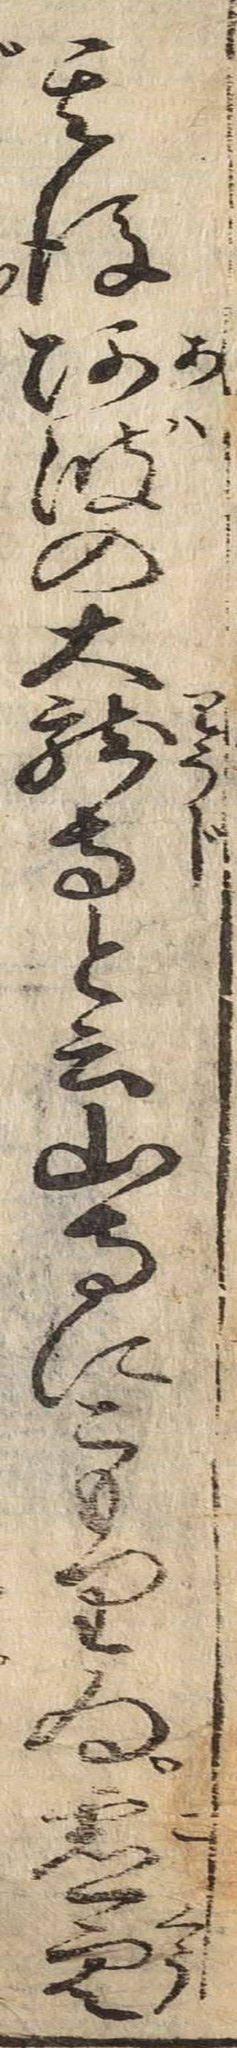其後阿波の大竜寺と云山寺にこもりゐ。虚空
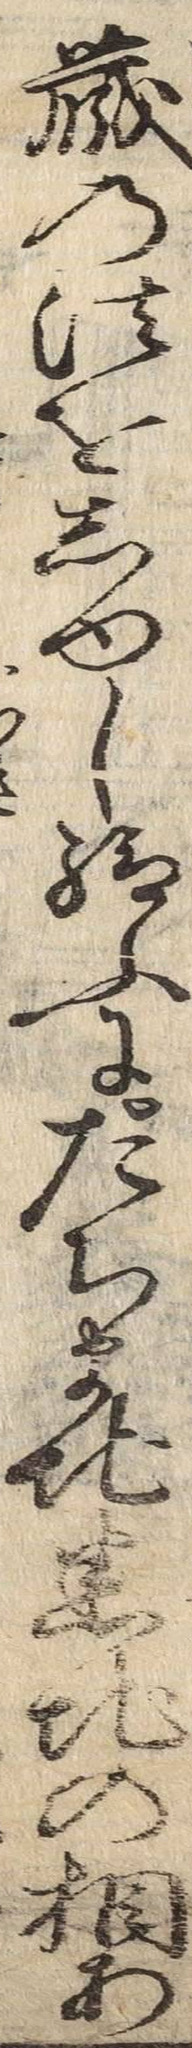蔵の法をしゆし給ふに。たちまち悉地の相あ
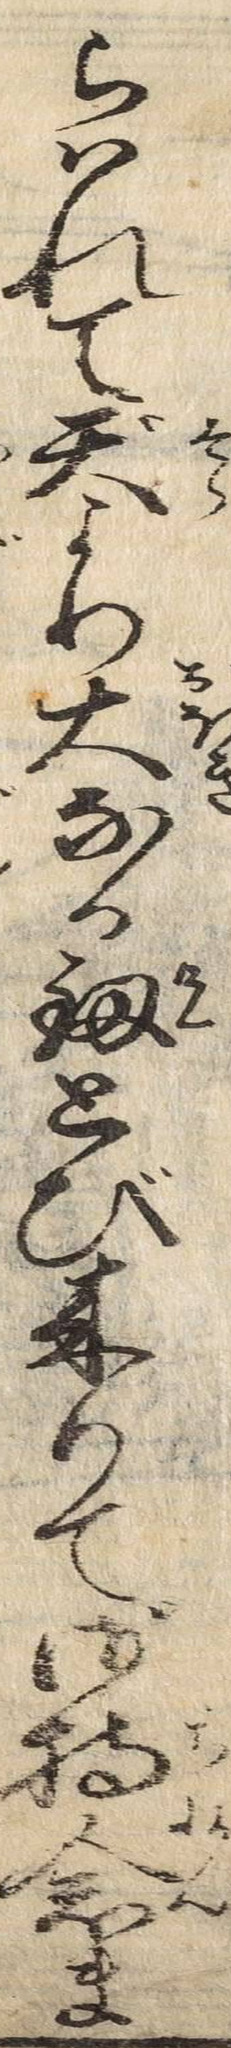らはれて。天より大なる剣とび来りて。御持念ま
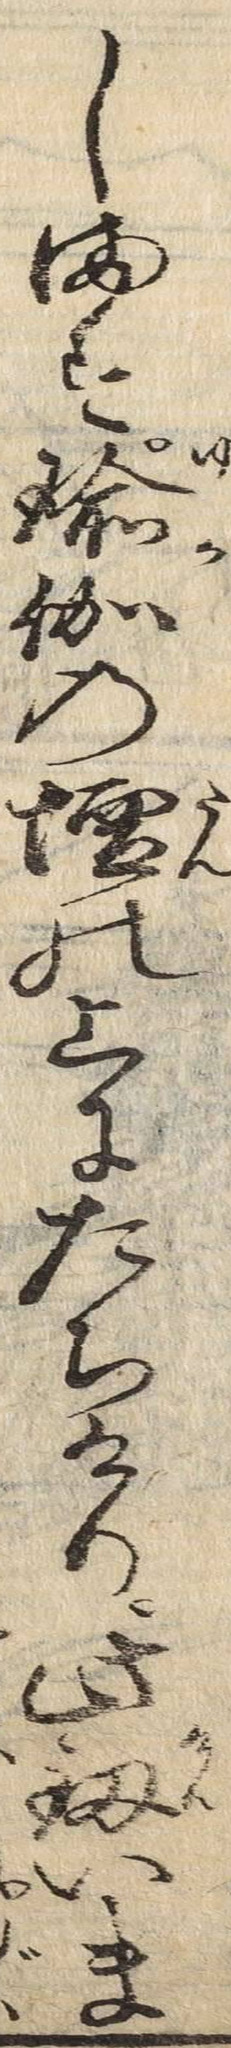します。瑜伽の壇の上にたちけり。此剣いま
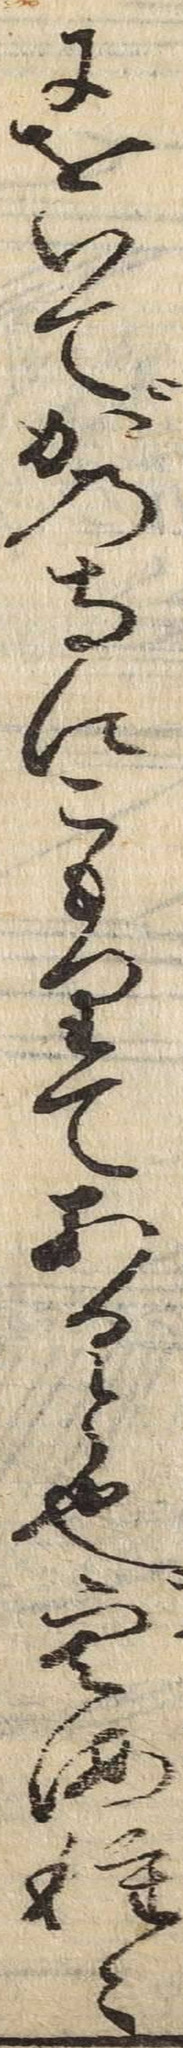にをいて。かの寺にこもりてあると也。空海種々
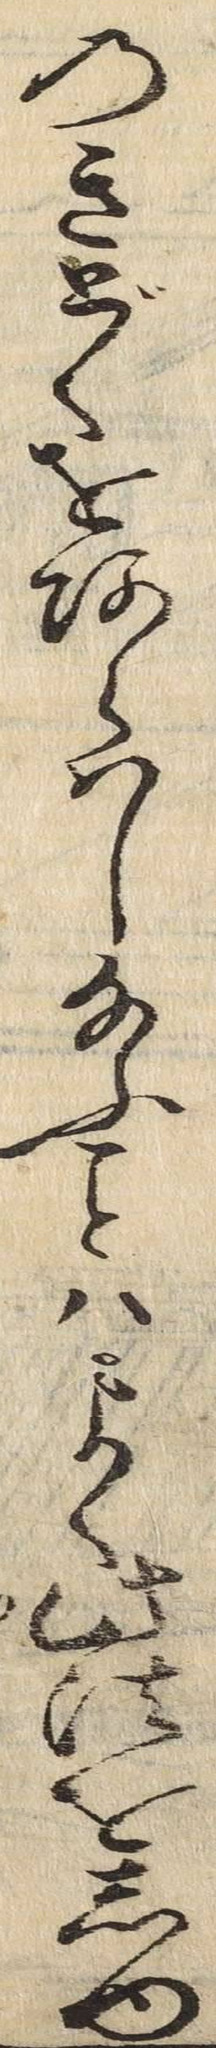のきどくをあらはし給ふことはよく此法をしゆ
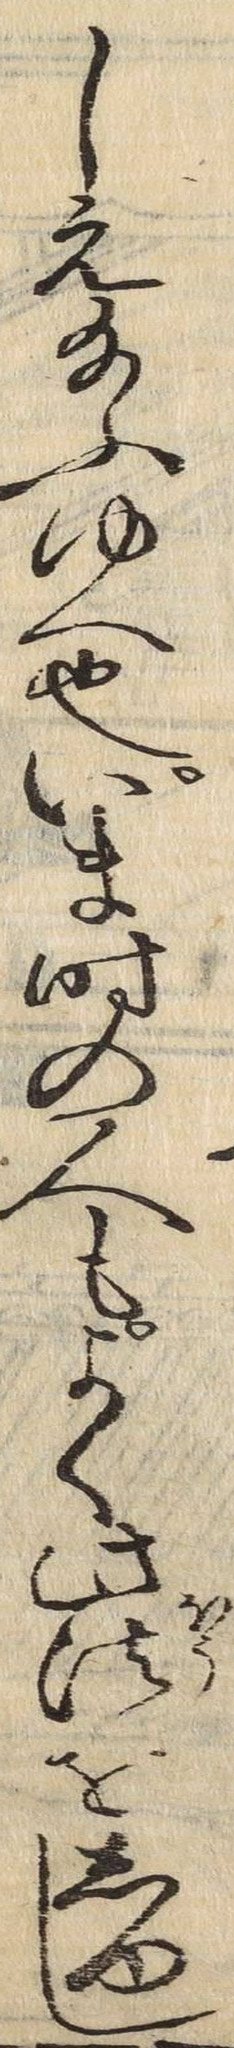しえ給ふゆへ也。いま時の人もよく此法をしゆし
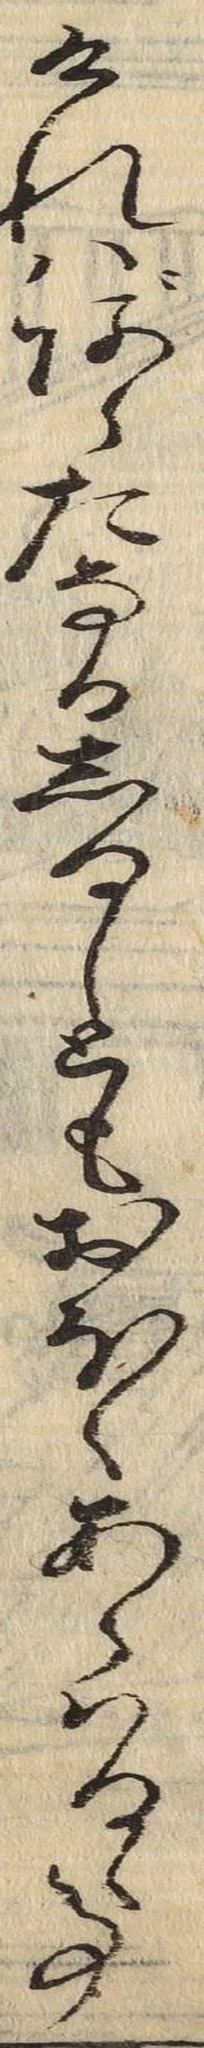けれは。あらたなるしるしともおほくあらはるゝ事
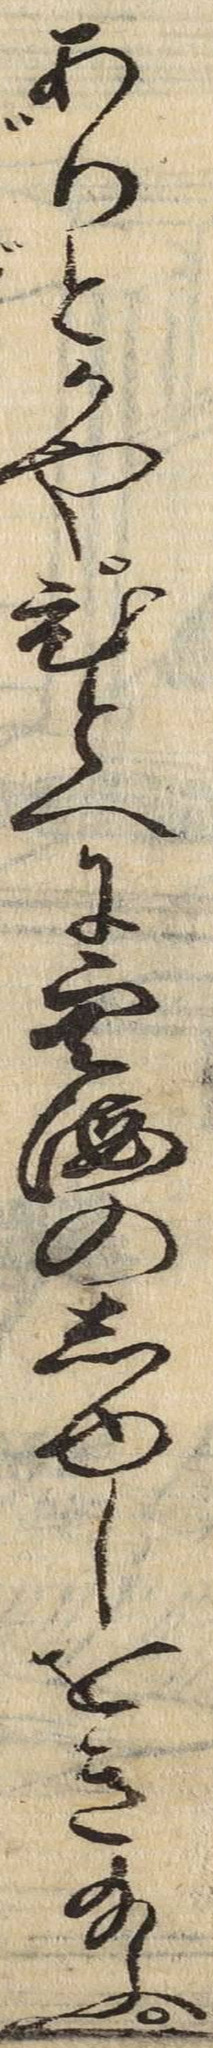ありとかや。ひとへに空海のしゆしをき給ふ。
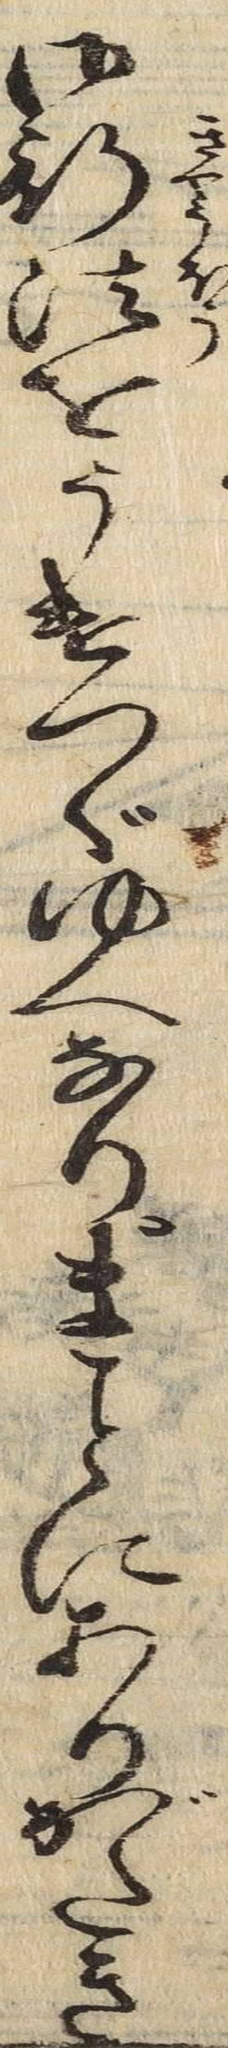御行法をうけつぐゆへなり。まことにありがたき
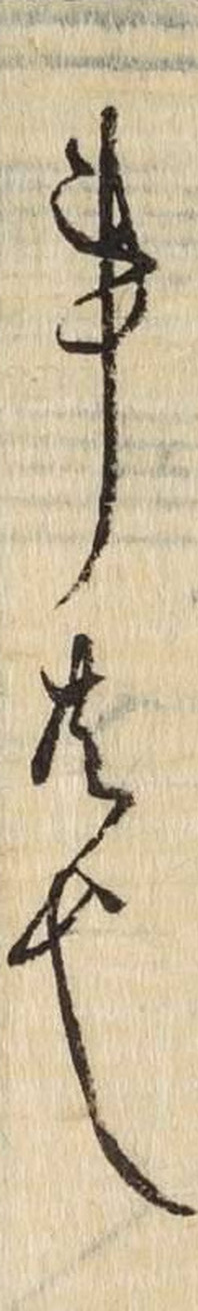事共也

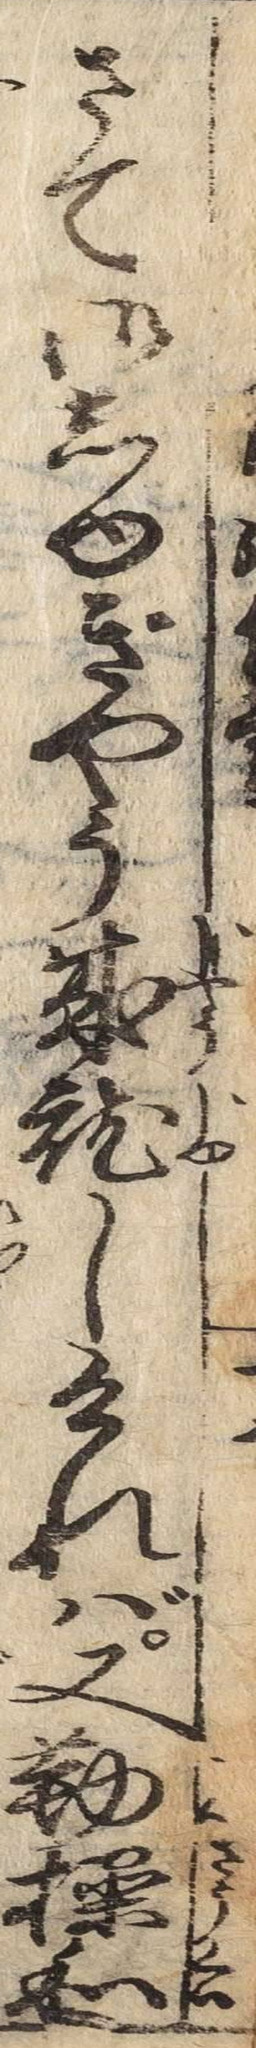さてごしゆぎやう成就しければ。又権操和
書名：弘法大師御傳記
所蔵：京都府立京都学・歴彩館 国文学研究資料館
